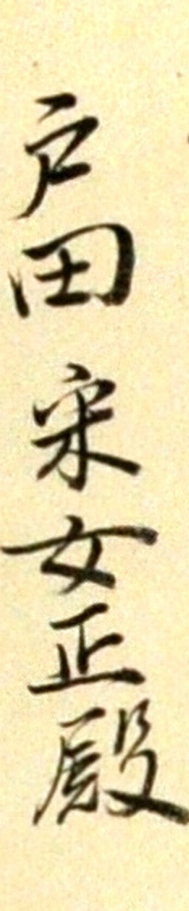戸田采女正殿
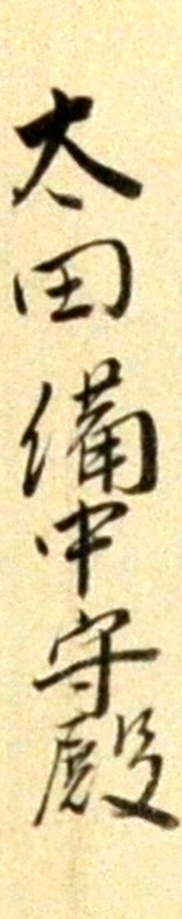太田備中守殿

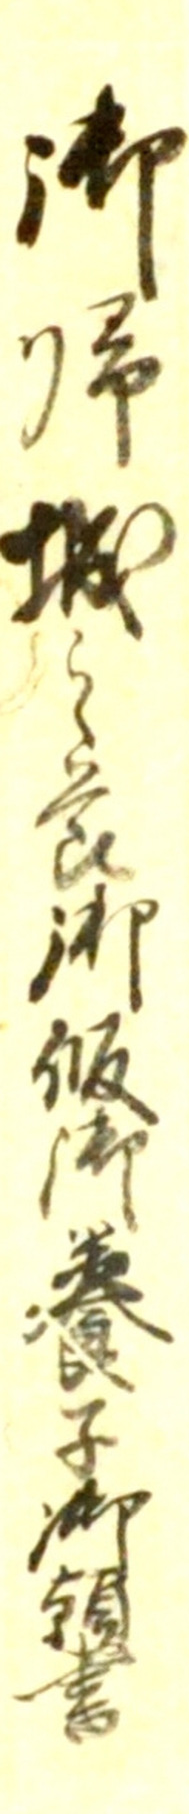御帰城之節御仮御養子御願書

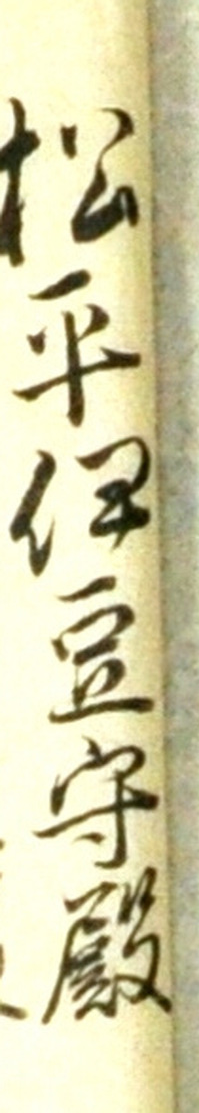松平伊豆守殿
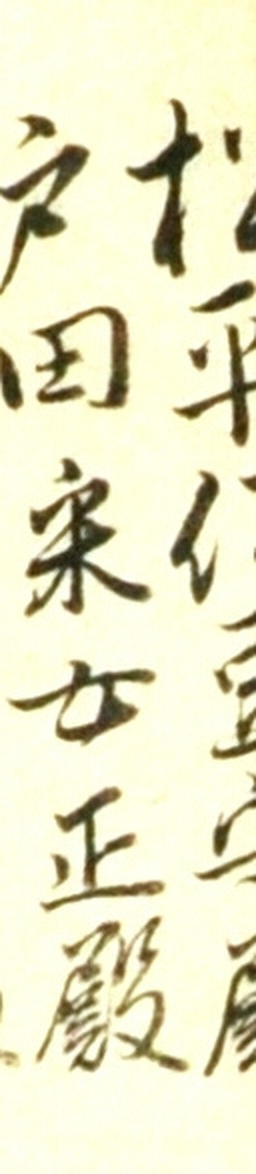戸田采女正殿
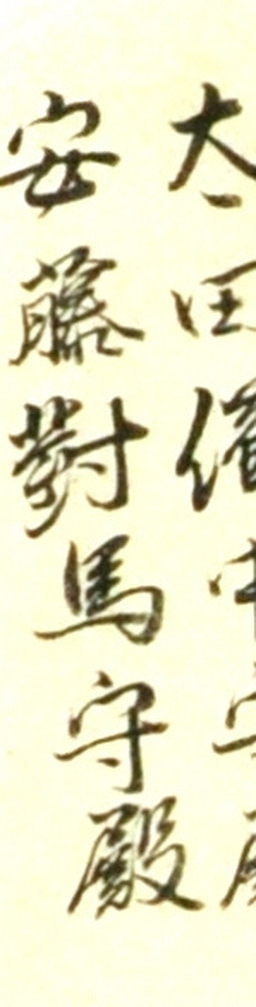安藤対馬守殿

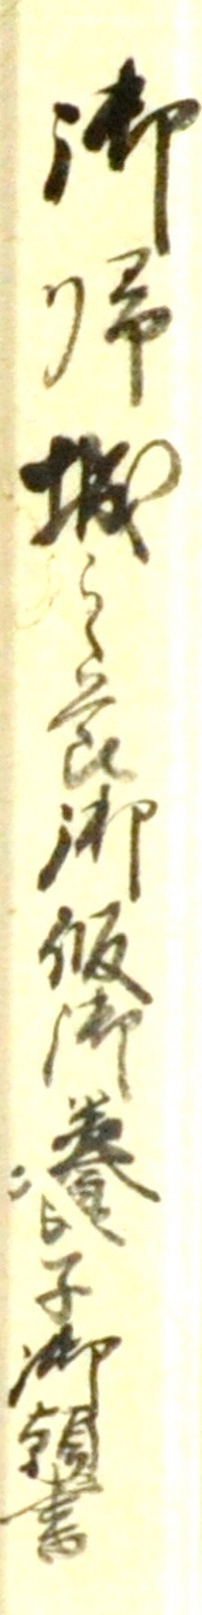御帰城之節御仮御養子御願書
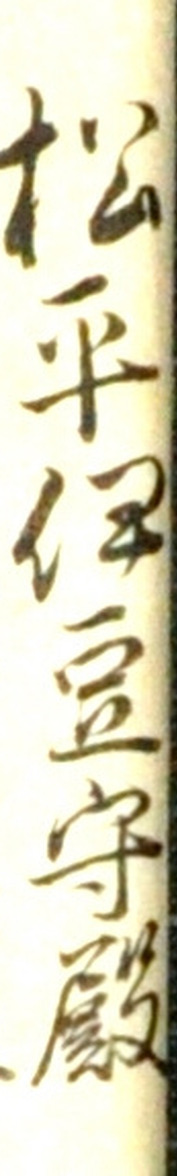松平伊豆守殿
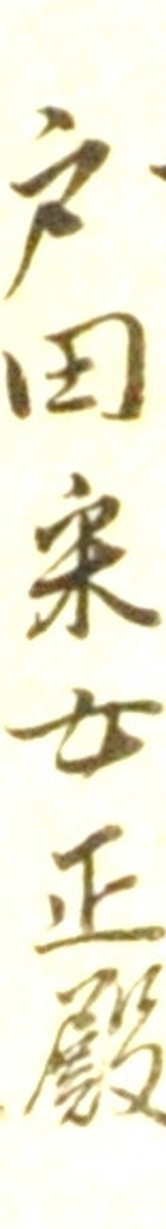戸田采女正殿
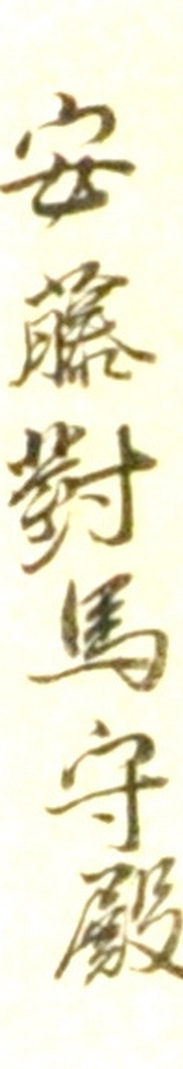安藤対馬守殿

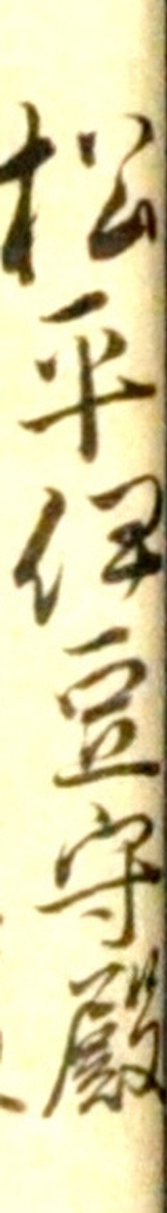松平伊豆守殿
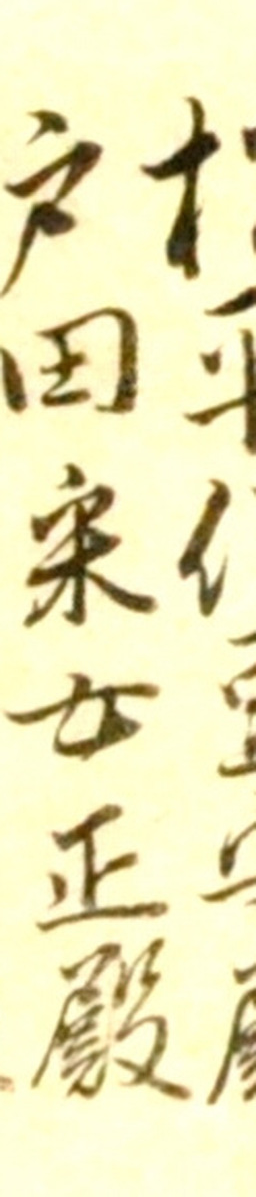戸田采女正殿
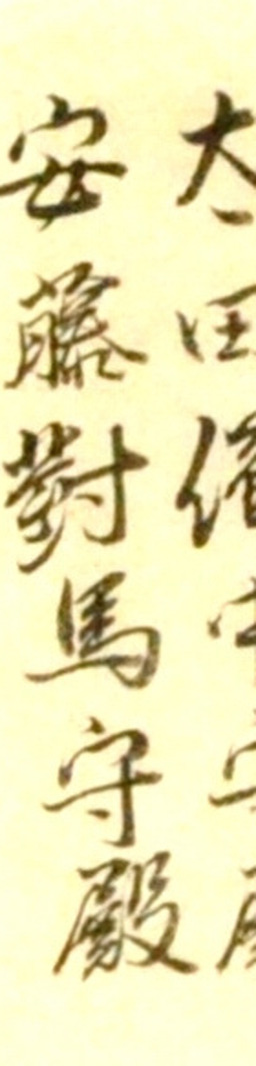安藤対馬守殿

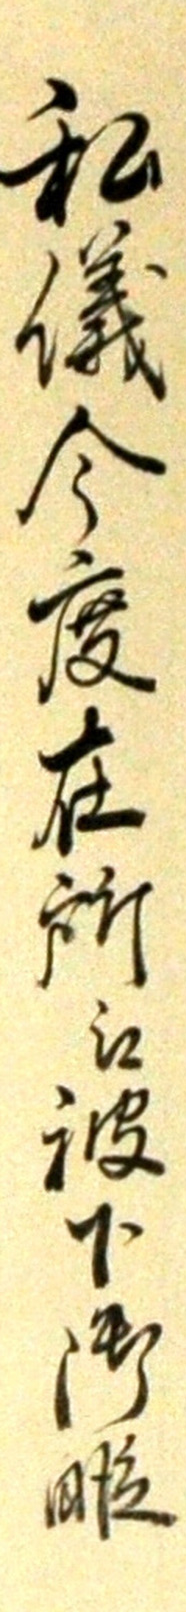私儀今度在所江被下御暇
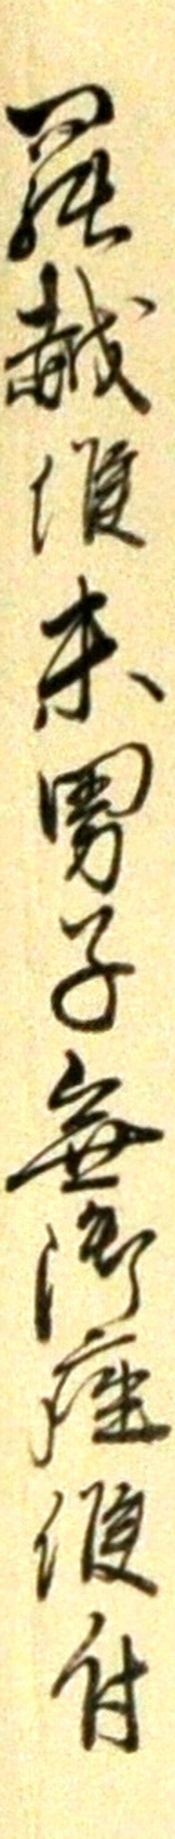罷越候未男子無御座候付
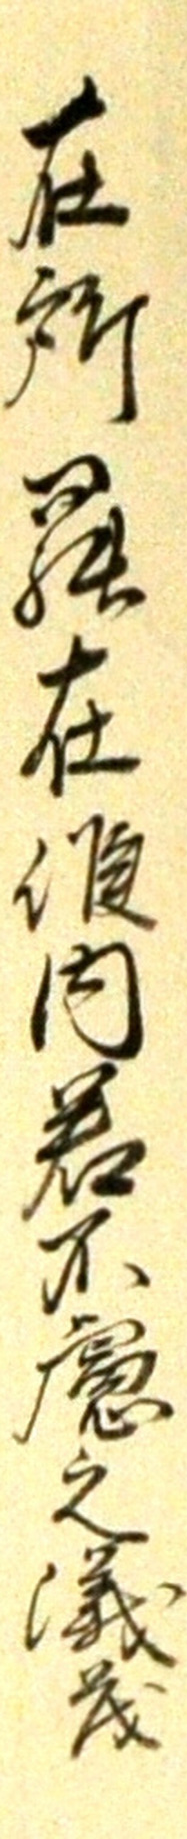在所罷在候内若不慮之儀茂
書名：仮養子願
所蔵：伊那市立高遠町図書館・合同会社AMANE
